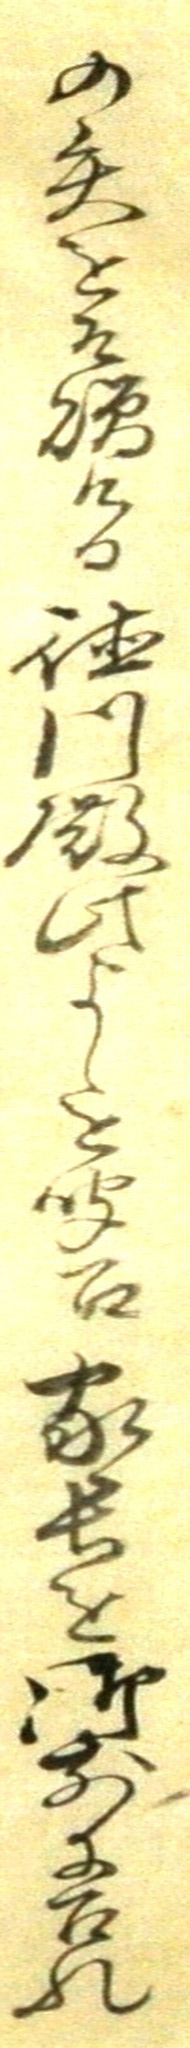の矢をそ贈ける徳川殿此よしを聞召家長を御前に召れ
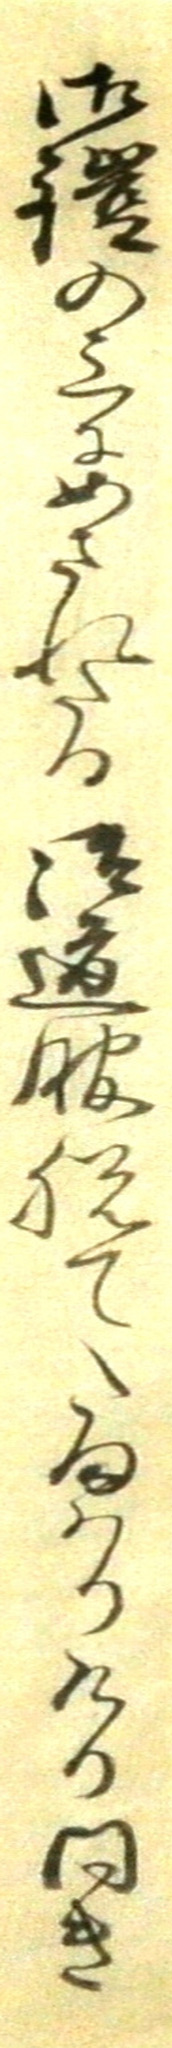御鎧の上にめされたる御道服脱てたまはりけり同き
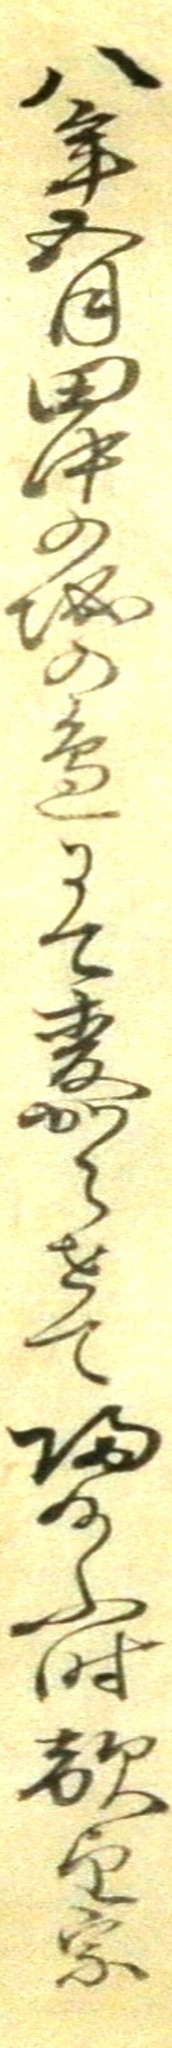八年五月田中の城の辺にて麦からせて帰給ふ時敵望宗
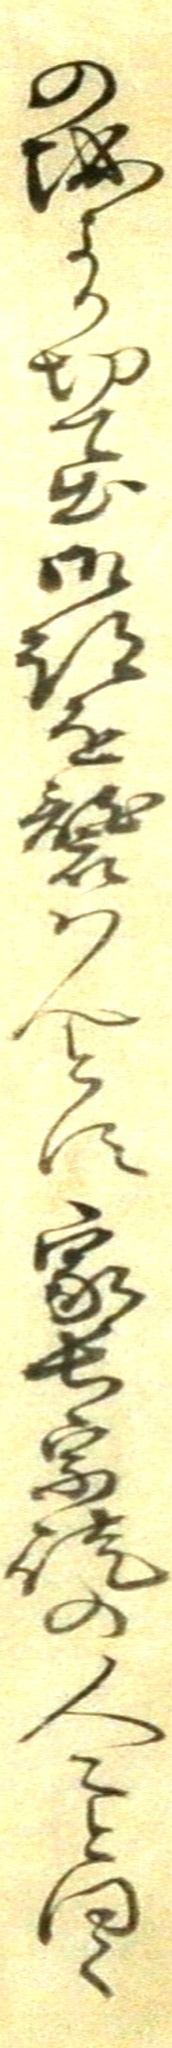の城より切て出御跡を襲わんとす家長宗徒の人々と同く
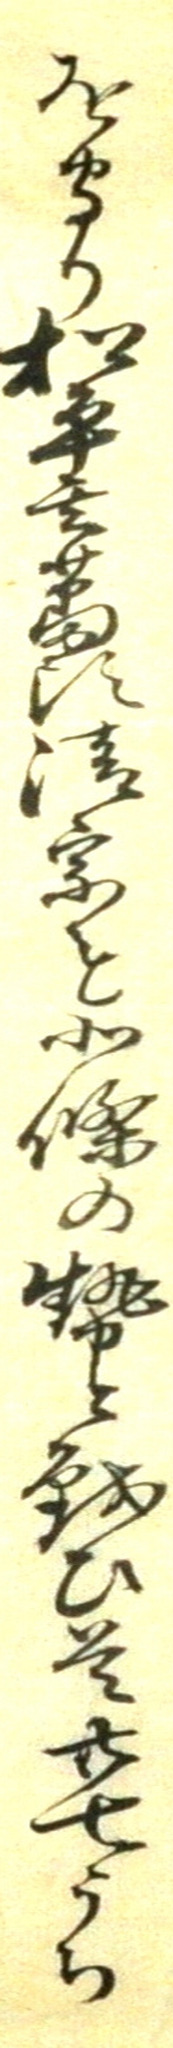を守り松平玄蕃頭清宗と北條の勢と戦ひ首廿七うち
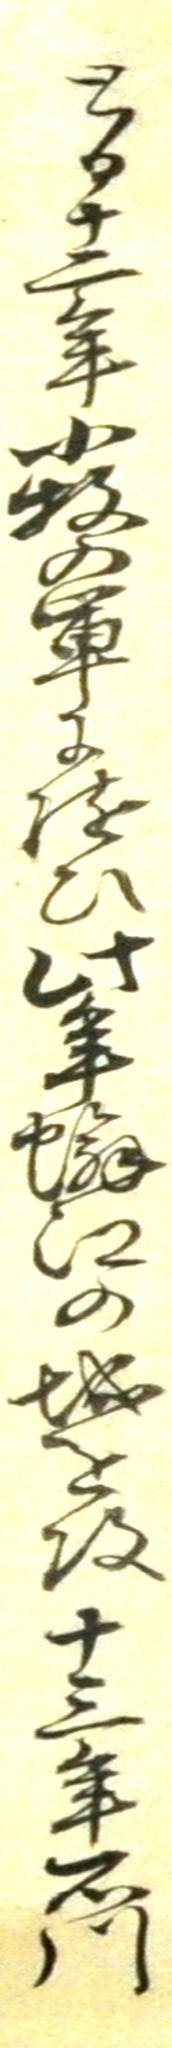とる十二年小牧の軍に随ひ此年蟹江の城を攻十三年石川
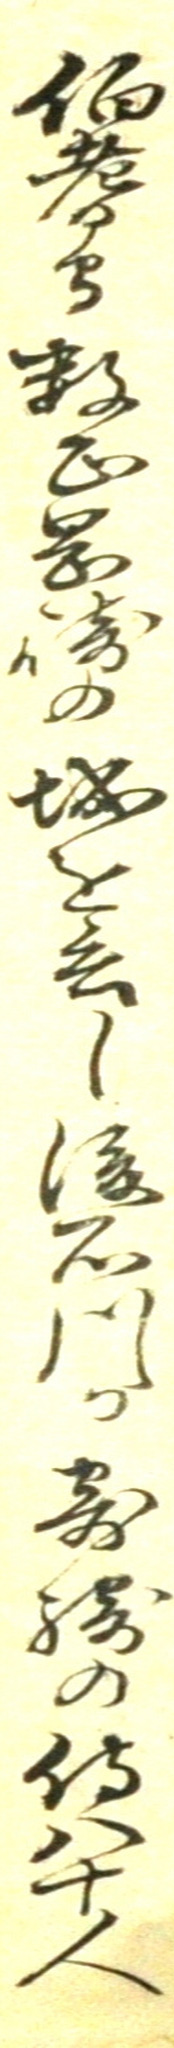伯耆守数正岡崎の城を去し後石川か寄騎の侍八十人
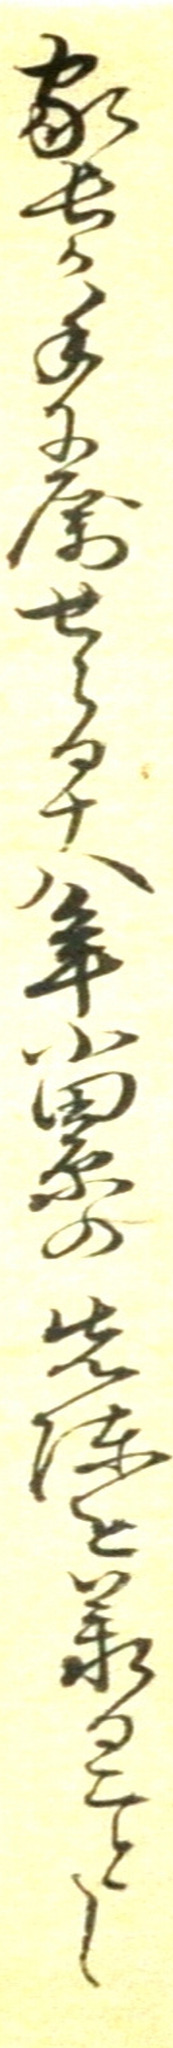家長か手に属せらる十八年小田原の先陣を承ることし
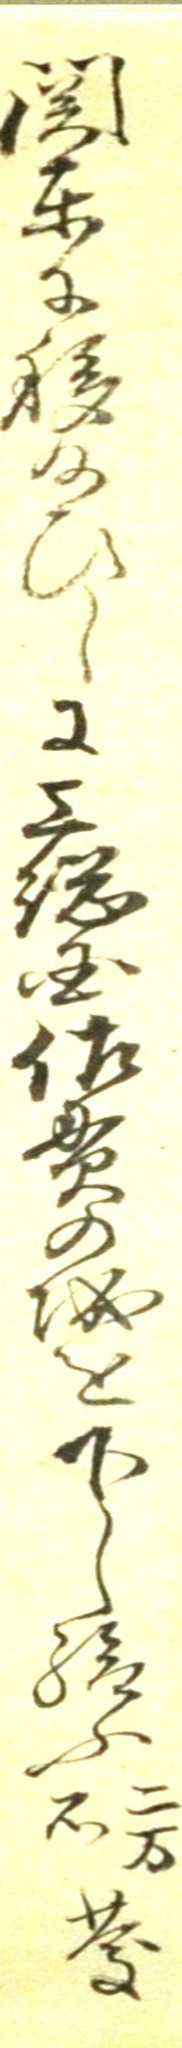関東に移給ひしに上総国佐貫の城を下し給ふ二万石慶
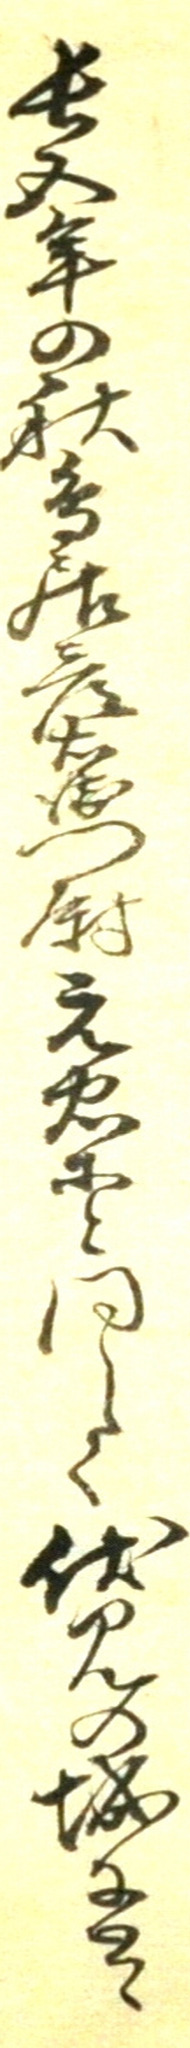長五年の秋鳥居彦右衛門尉元忠等と同しく伏見の城にとゝ
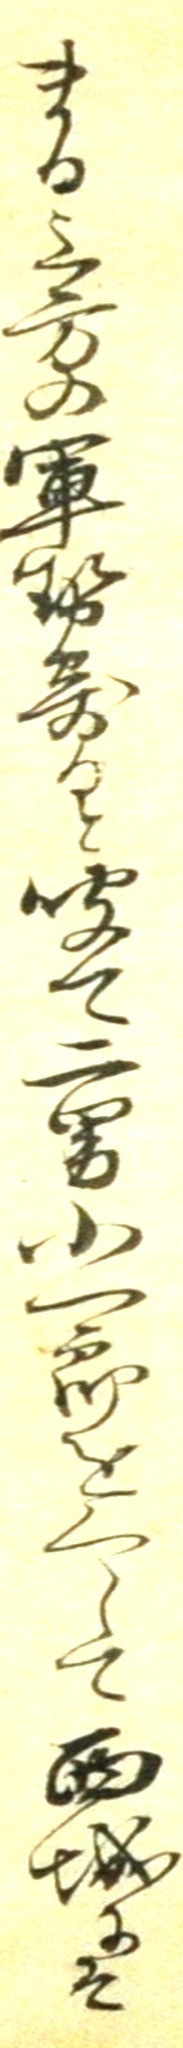まる上方の軍勢寄ると聞て二男小一郎をくして西城にそ
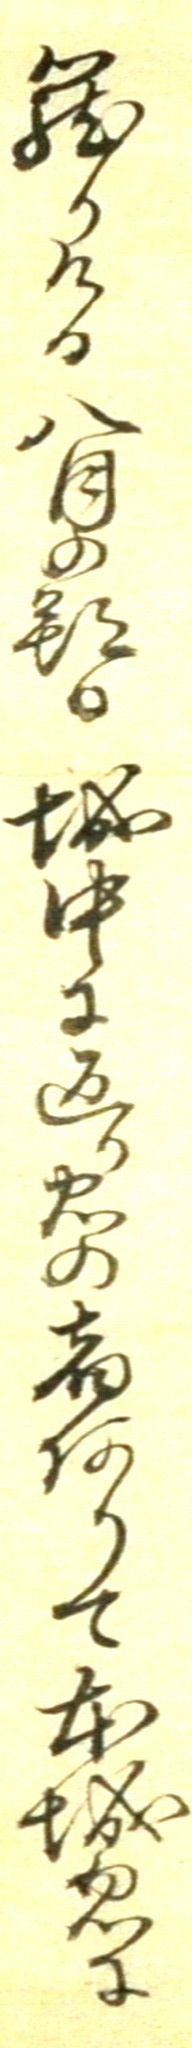籠りける八月の朔日城中に返り忠の者ありて本城忽に
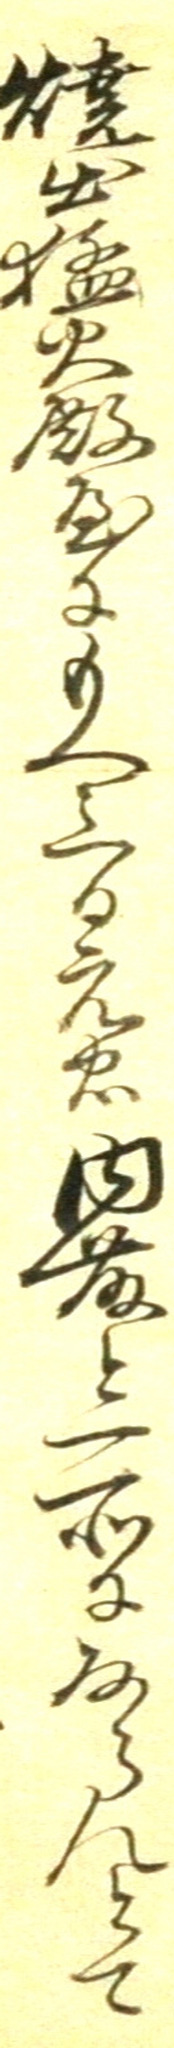焼出猛火殿屋にもへ上る元忠内藤と一所にならんとて
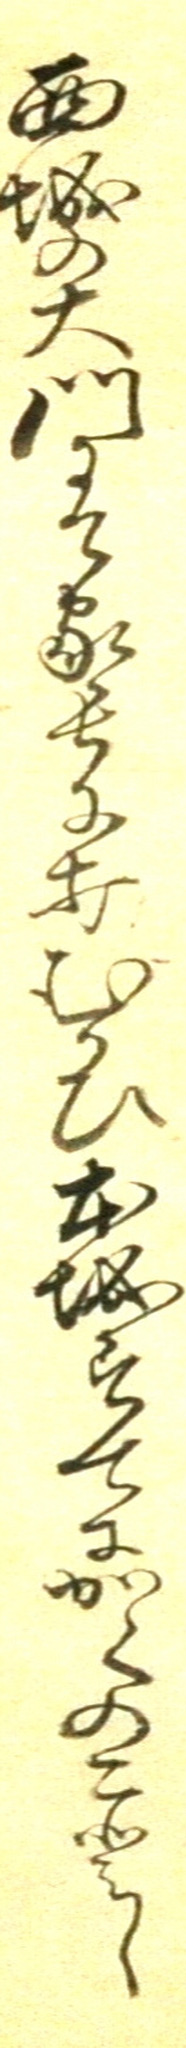西城の大門にて家長に打むかひ本城すてにかくのことし
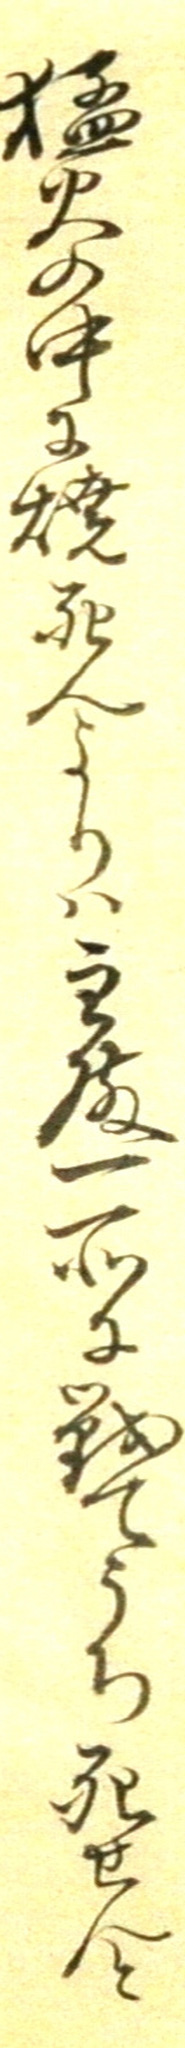猛火の中に焼死んよりは主殿一所に戦てうち死せんと
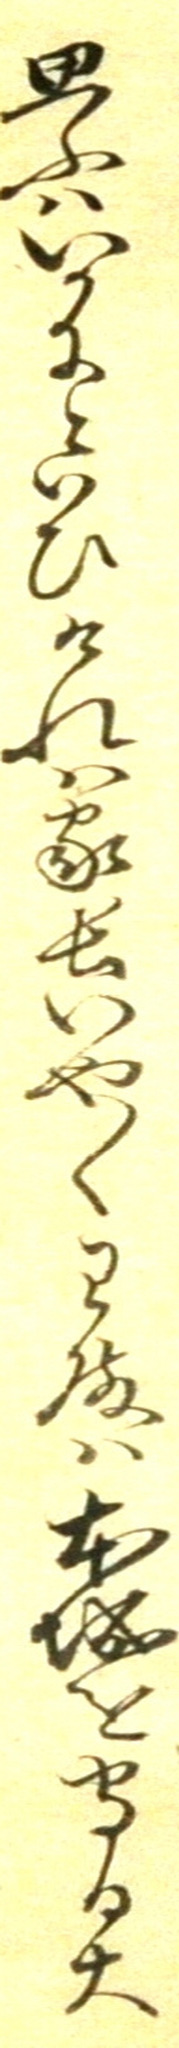思ふはいかにといひけれは家長いや〳〵わ殿は本城を守る大
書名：藩翰譜（四・中）
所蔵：伊那市立高遠町図書館・合同会社AMANE
